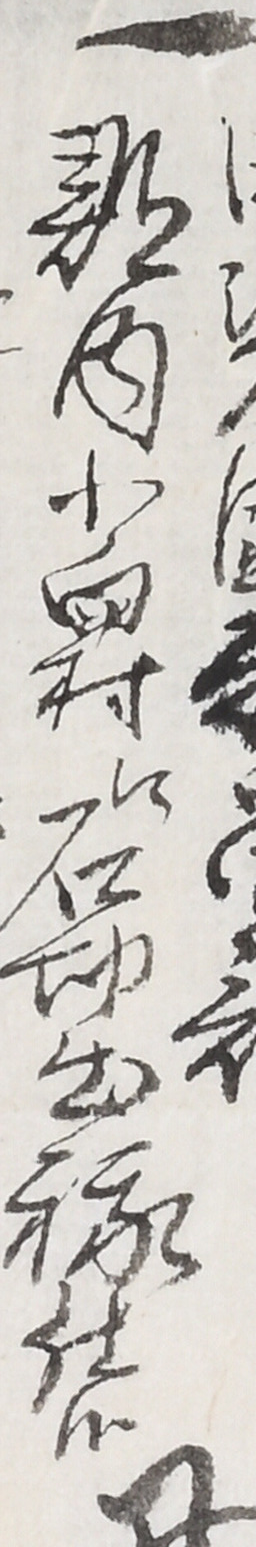一郡内真木村ニ石切出稼仕候
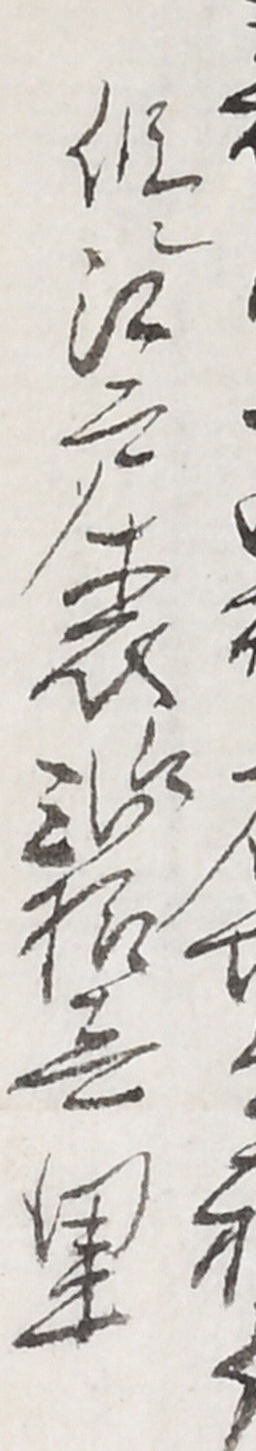但し江戸表え弐拾四里
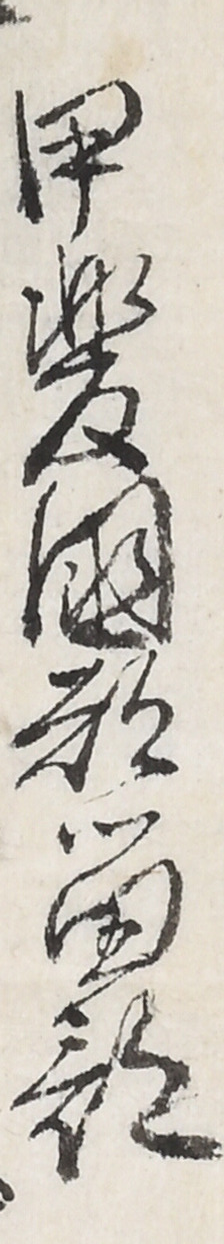甲斐国都留郡
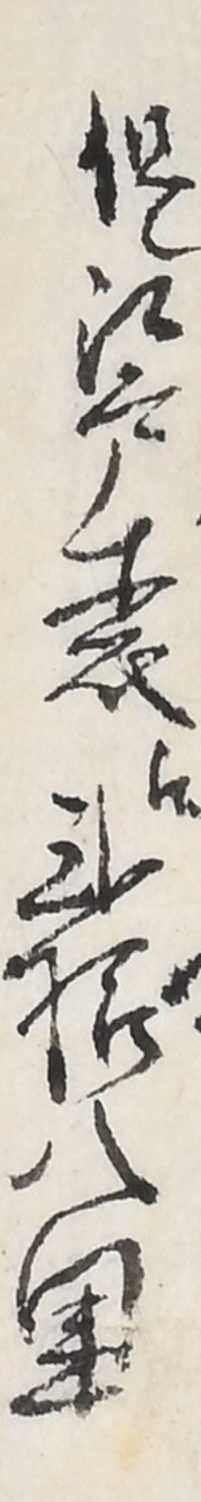但し江戸表え弐拾四里
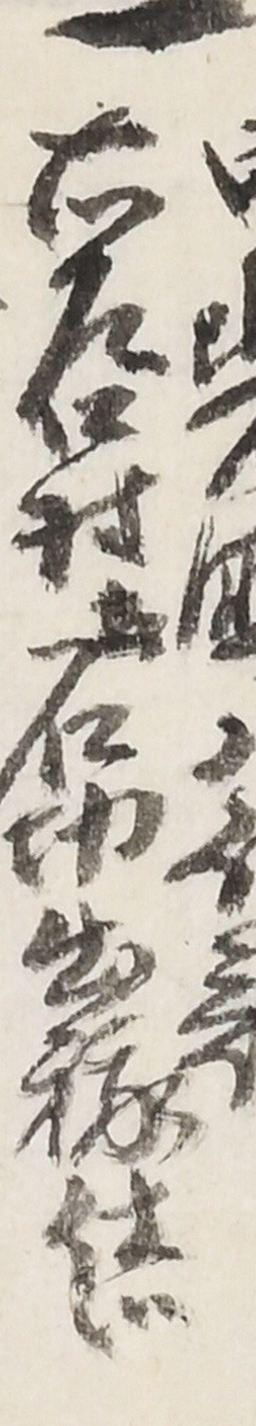一郡内真木村ニ石切出稼仕候
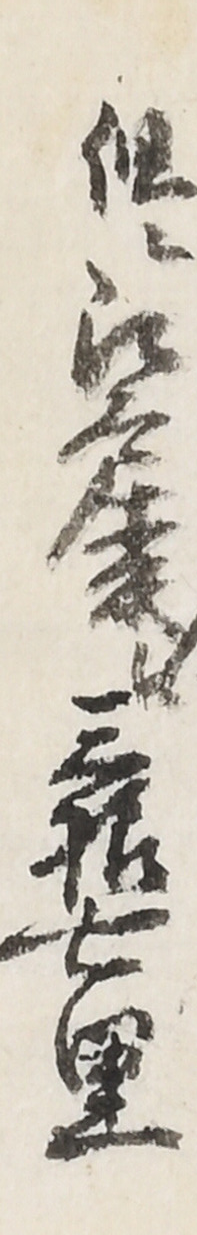但し江戸表え三拾五里
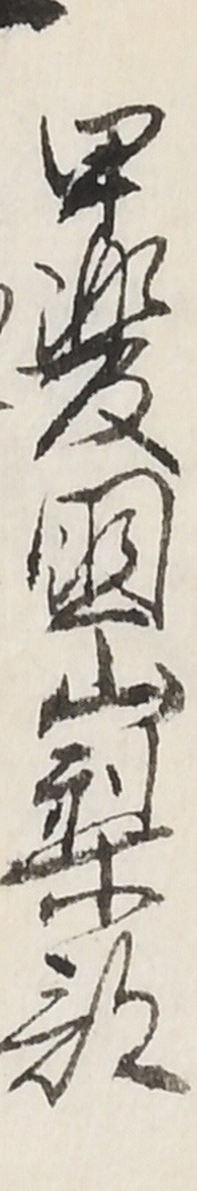甲斐国山梨郡
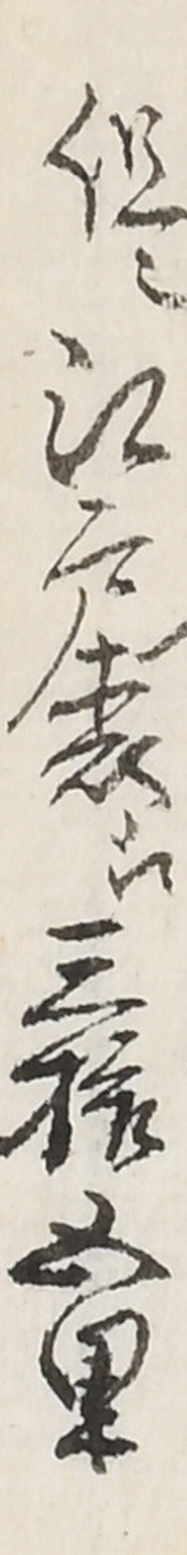但し江戸表え三拾五里
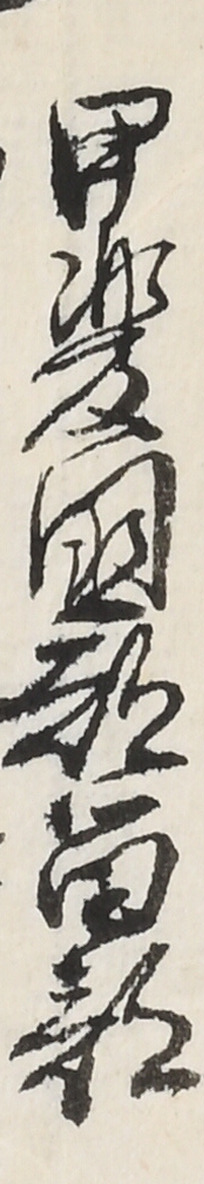甲斐国都留郡
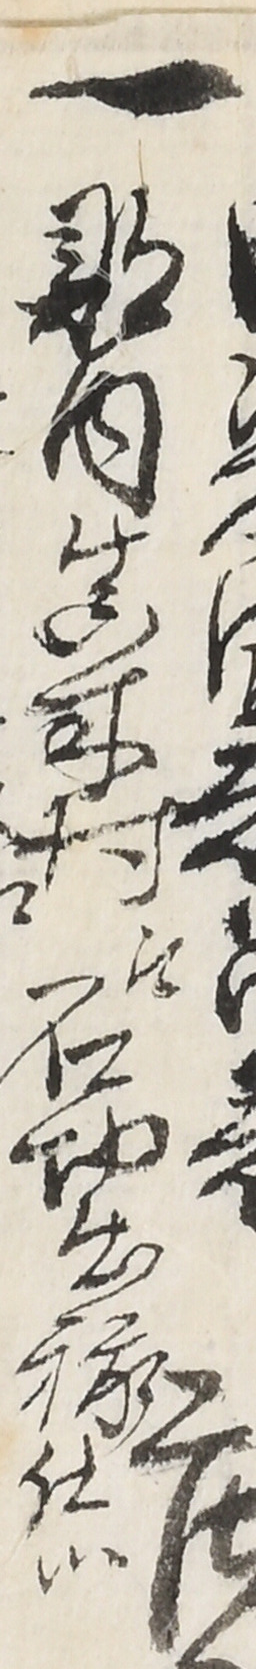一郡内真木村ニ石切出稼仕候
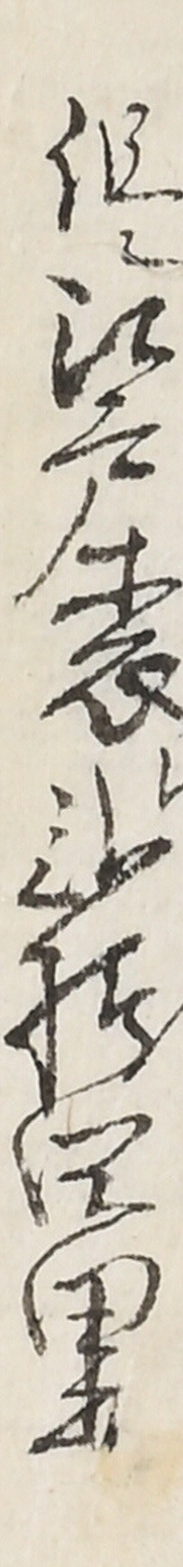但し江戸表え弐拾四里
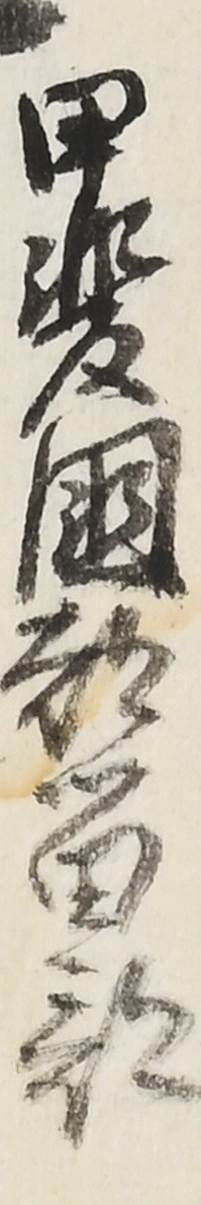甲斐国都留郡
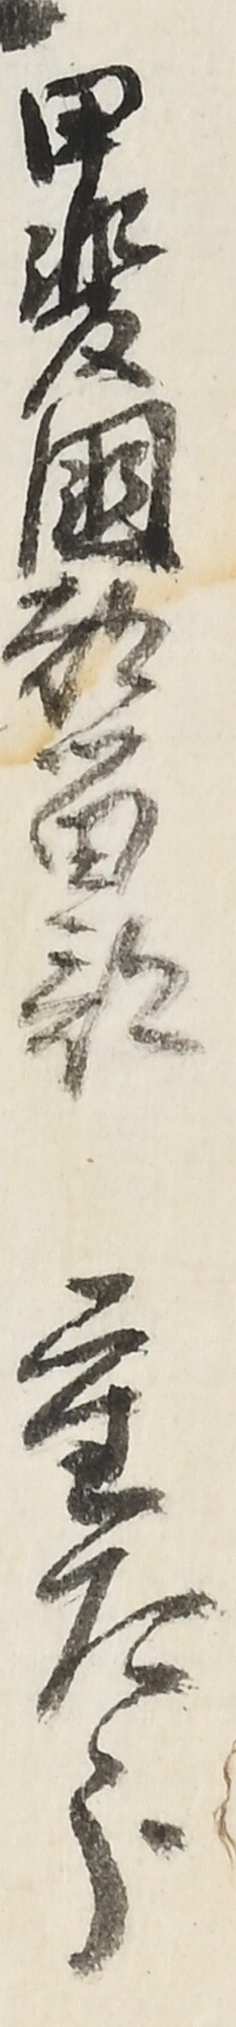甲斐国都留郡重太郎
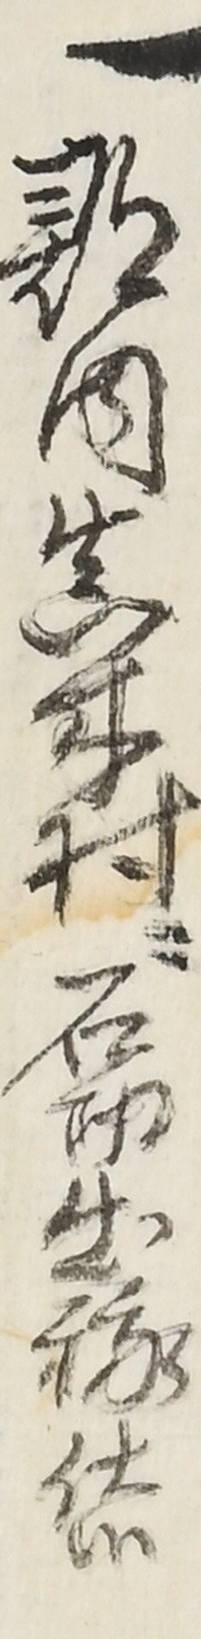一郡内真木村ニ石切出稼仕候
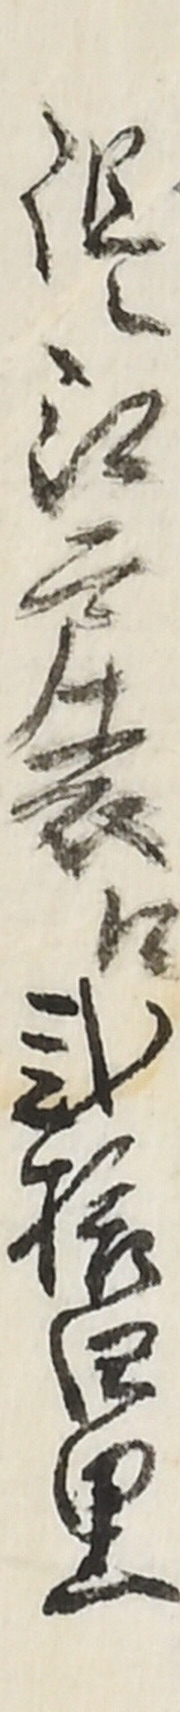但し江戸表え弐拾四里
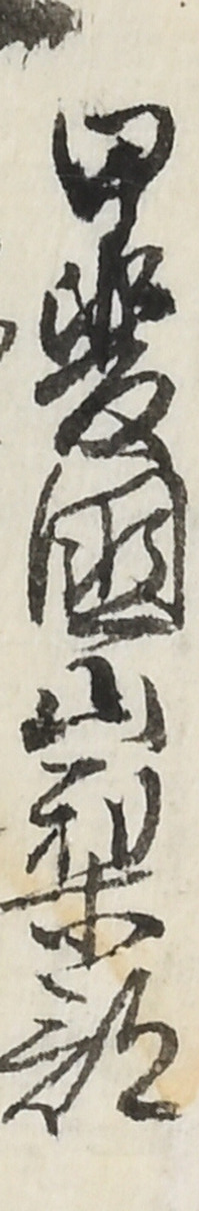甲斐国山梨郡
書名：嘉永五壬子年正月江戸近國石切出稼名前書上帳
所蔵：伊那市立高遠町図書館・合同会社AMANE
